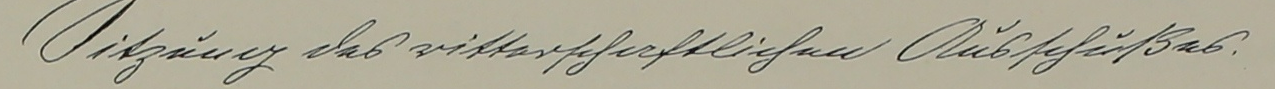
Sitzung des ritterschaftlichen Ausschußes.
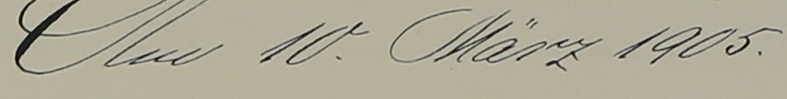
Am 10. März 1905.
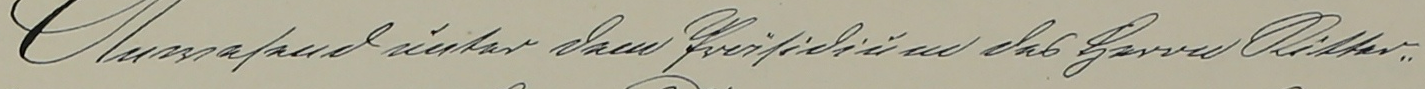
Anwesend unter dem Präsidium des Herrn Ritter-
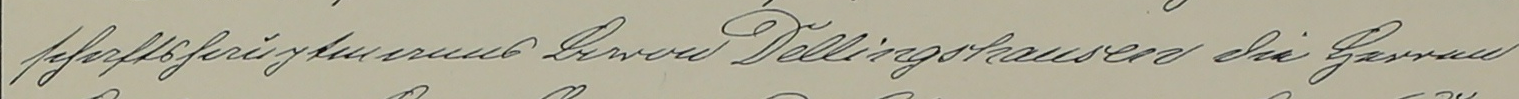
schaftshauptmanns Baron Dellingshausen die Herren
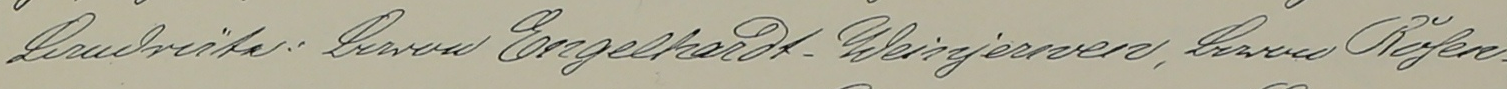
Landräte: Baron Engelhardt-Weinjerwen, Baron Rosen-
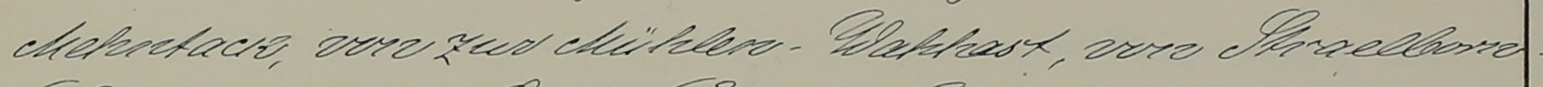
Mehntack, von zur Mühlen-Wahhast, von Straelborn-
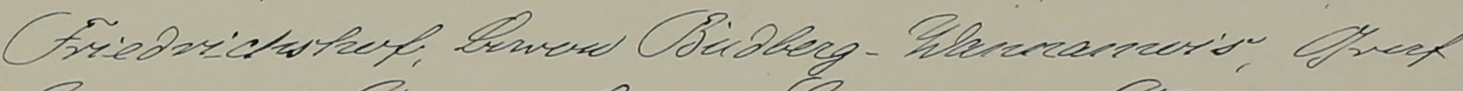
Friedrichshof, Baron Budberg-Wannamois, Graf
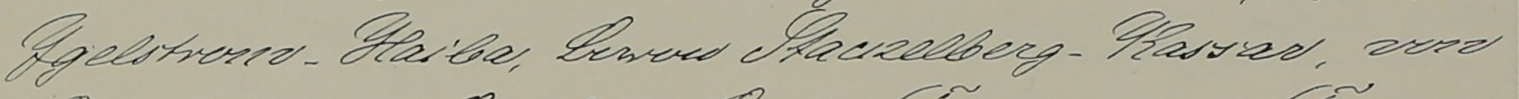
Igelstrom-Haiba, Baron Stackelberg-Kassar, von
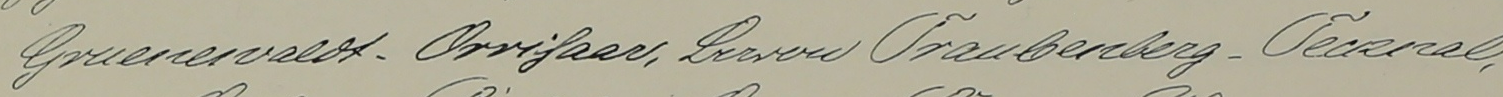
Gruenewaldt-Orrisaar, Baron Traubenberg-Tecknal,
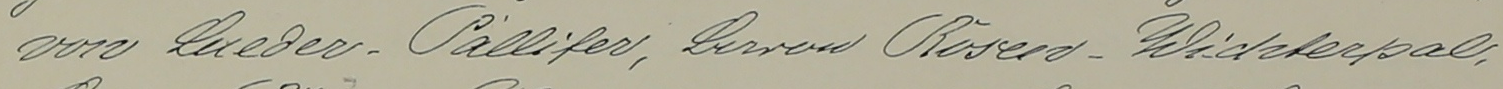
von Lueder-Pallifer, Baron Rosen-Wichterpal,
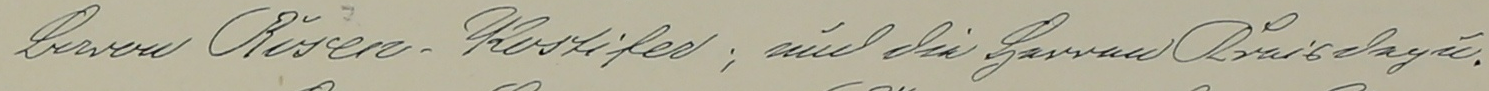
Baron Rosen-Kostifer; und die Herren Kreisdepu-
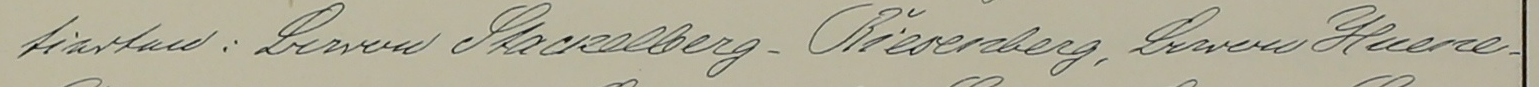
tierten: Baron Stackelberg-Riesenberg, Baron Huene-
